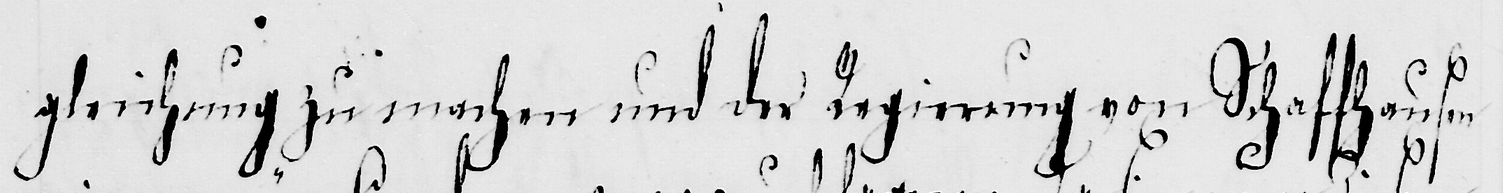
gleichung zu machen und der Regierung von Schaffhausen
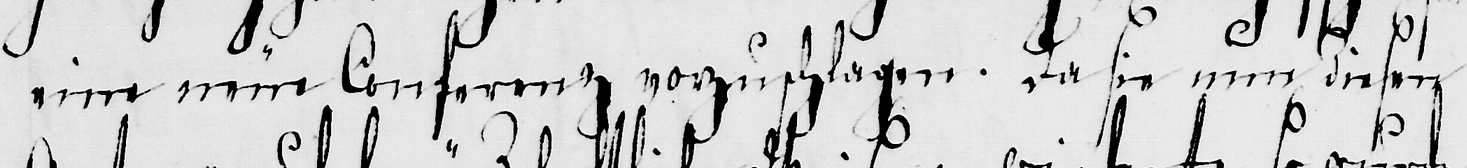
eine neue Conferenz vorzuschlagen. Da sie nun diesen
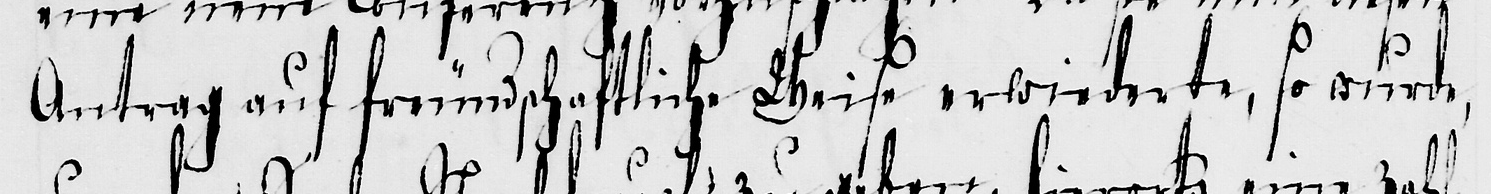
Antrag auf freundschaftliche Weise erwiederte, so wurde,
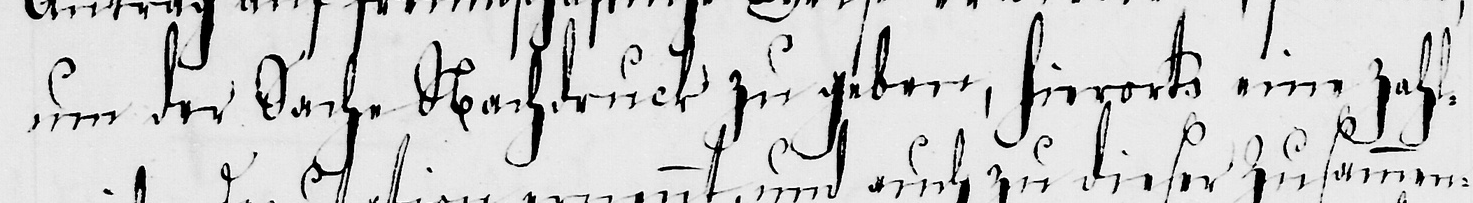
um der Sache Nachdruck zu geben, hierorts eine zahl¬
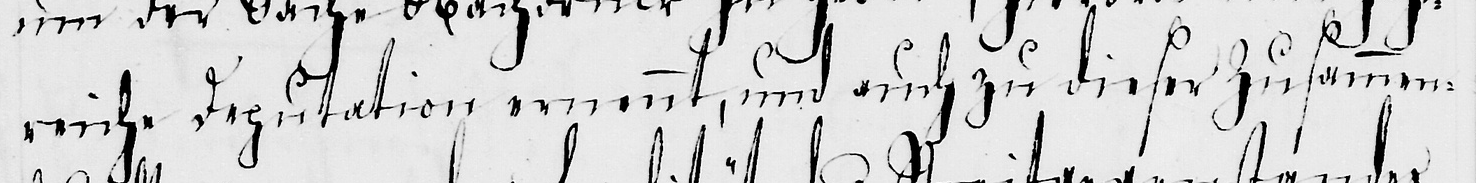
reiche Deputation ernannt, und auch zu dieser Zusammen¬
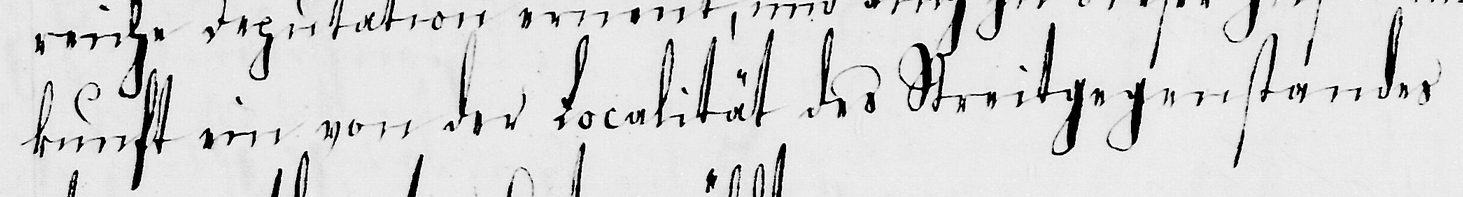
kunft ein von der Localität des Streitgegenstandes
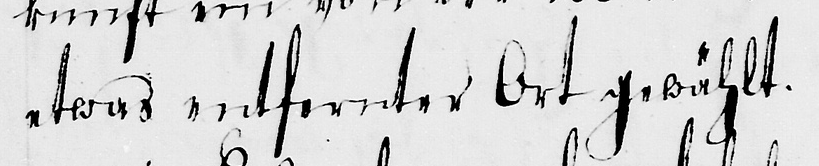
etwas entfernter Ort gewählt.
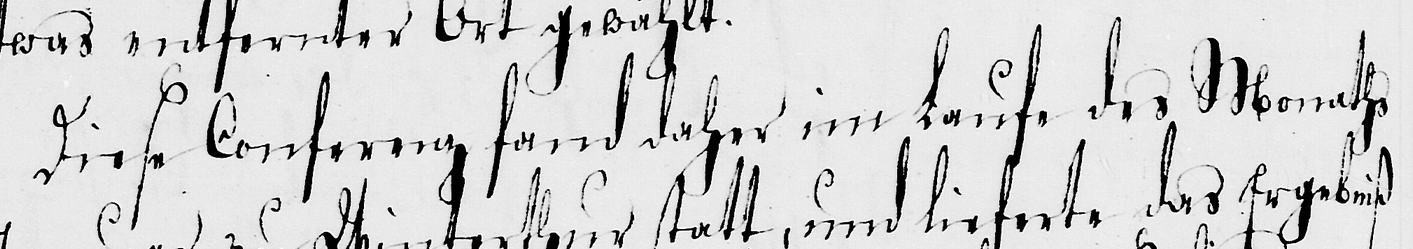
Diese Conferenz fand daher im Laufe des Monaths
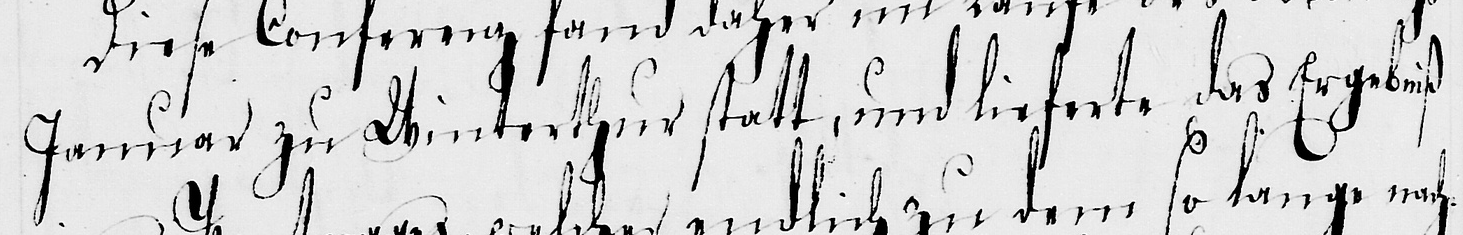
Januar zu Winterthur statt, und lieferte das Ergebniß
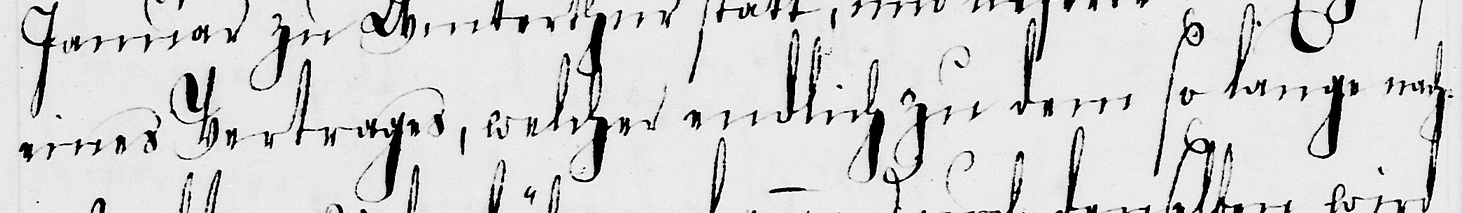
eines Vertrages, welcher endlich zu dem so lange na¬
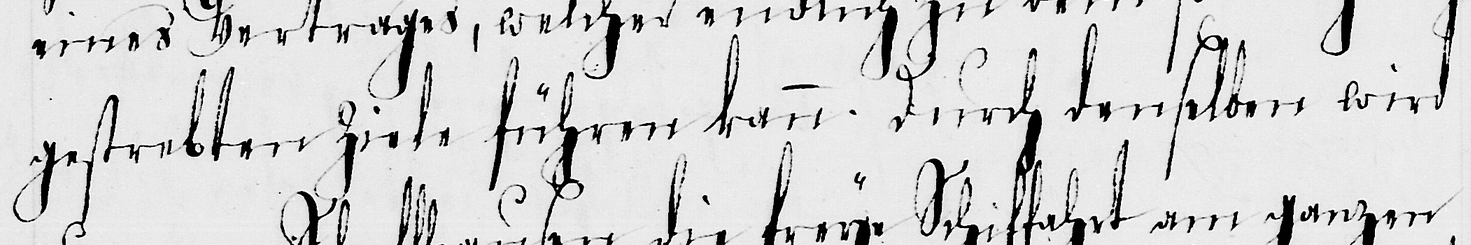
gestrebten Ziele führen kann. Durch denselben wird
